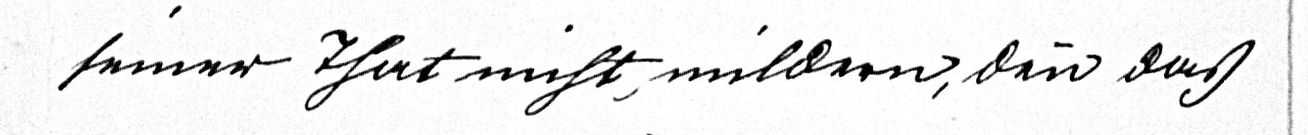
seiner That nicht, mildern, denn das
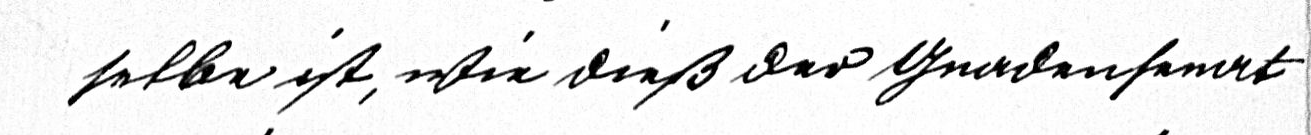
selbe ist, wie dieß der Gnadensenat
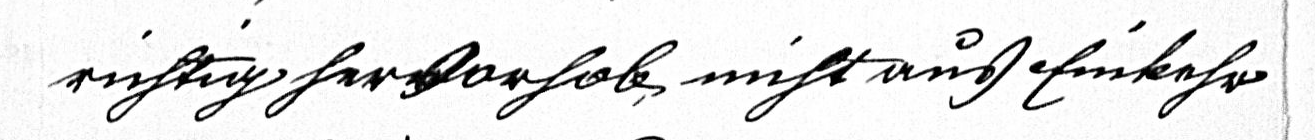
richtig hervorhob, nicht aus Einkehr
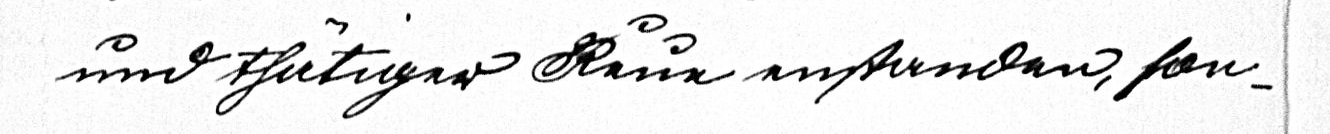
und thätiger Reue enstanden, son¬
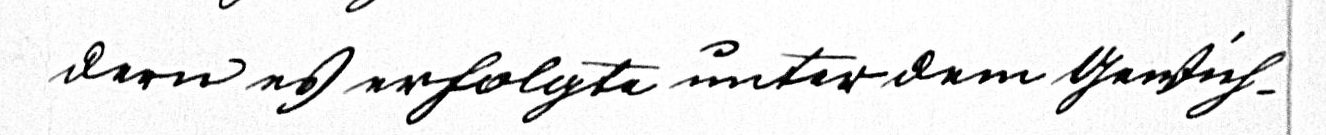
dern es erfolgte unter dem Gewich¬
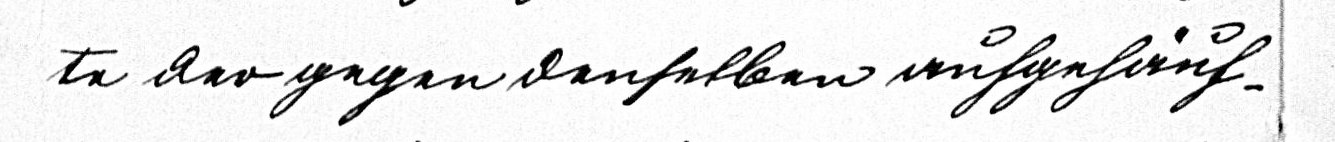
te der gegen denselben aufgehäuf¬
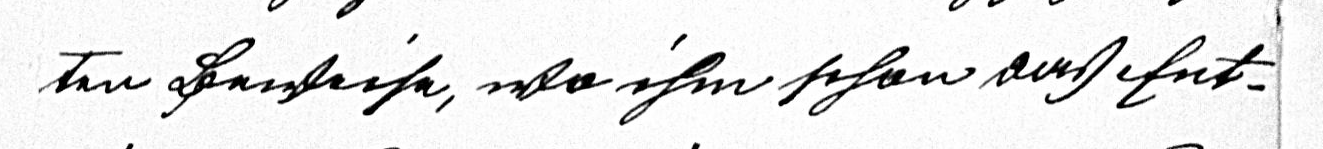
ten Beweise, wo ihm schon das Ent¬
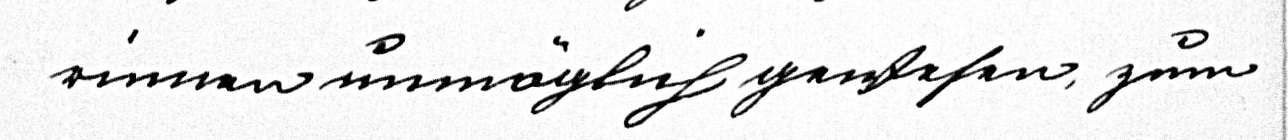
rinnen unmöglich gewesen, zum
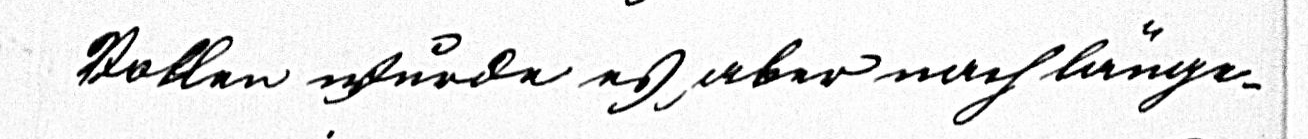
Vollen wurde es, aber nach länge¬
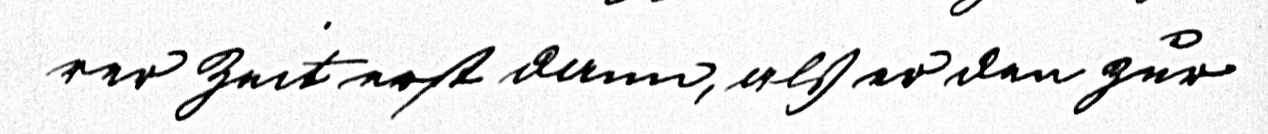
rer Zeit erst dann, als er den zur
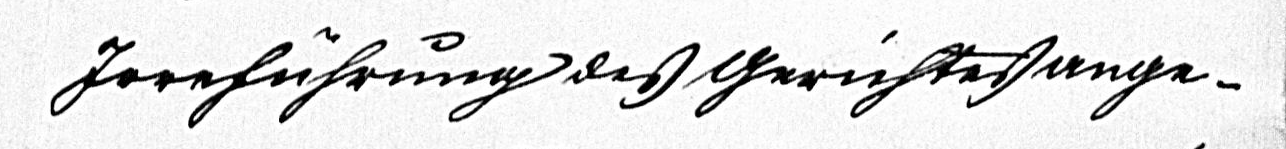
Irreführung des Gerichtesange¬
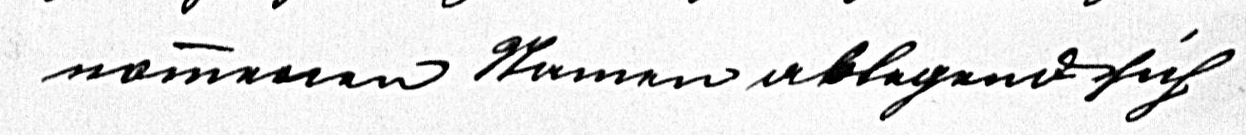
nommenen Namen ablegend sich
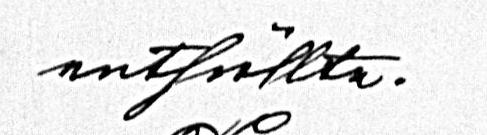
enthüllte.
